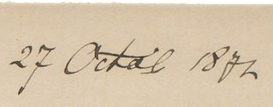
27 Octob 1871
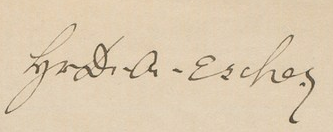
Hr Dr. A. Escher.
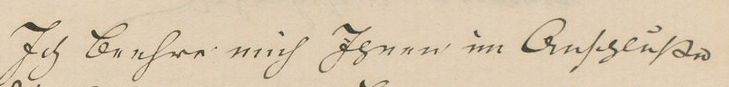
Ich beehre mich Ihnen im Anschluße
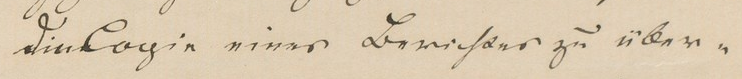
die Copie eines Berichtes zu über-
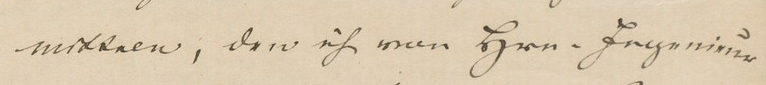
mitteln, den ich von Hrn. Ingenieur
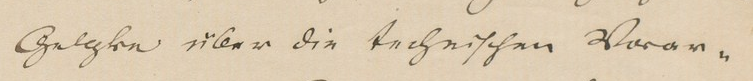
Gelpke über die technischen Vorar-
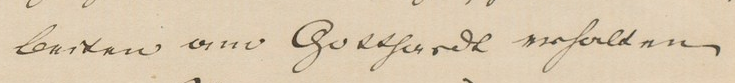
beiten am Gotthardt erhalten
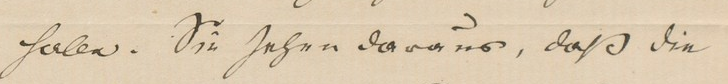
habe. Sie sehen daraus, daß die
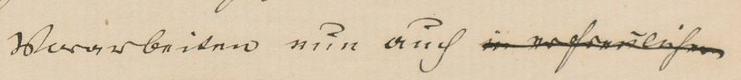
Vorarbeiten nun auch in erfreulicher
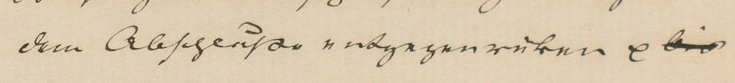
dem Abschluße entgegenrüken & bis
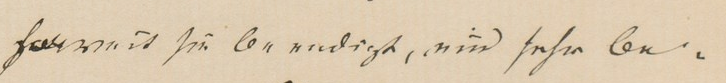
soweit sie beendigt, ein sehr be-
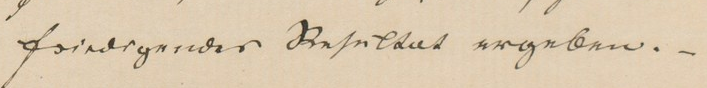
friedigendes Resultat ergeben. –
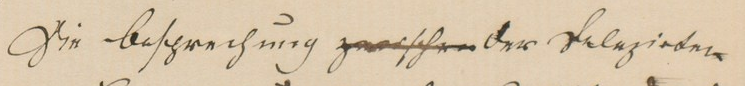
Die Besprechung zwischen der Delegirten
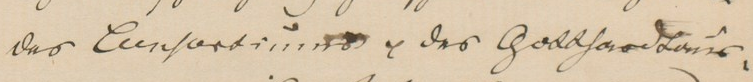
des Consortiums & des Gotthardtaus-
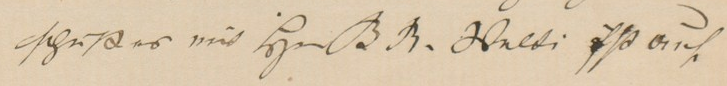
schußes mit Hrn BR. Welti ist auf
